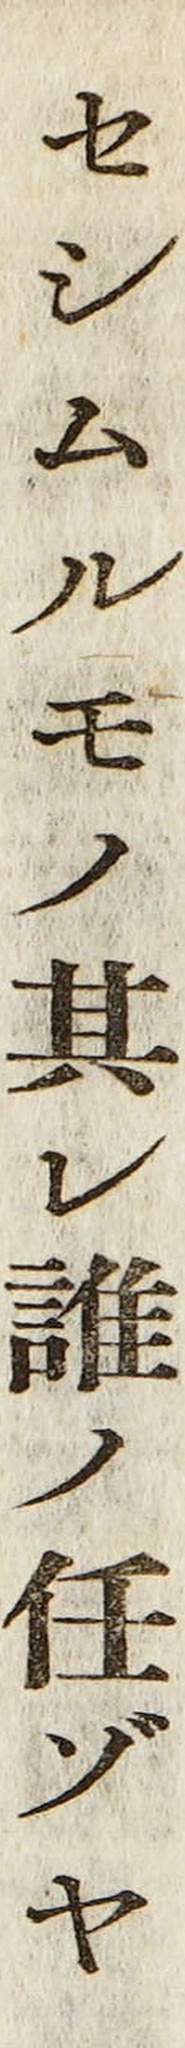セシムルモノ其レ誰ノ任ゾヤ
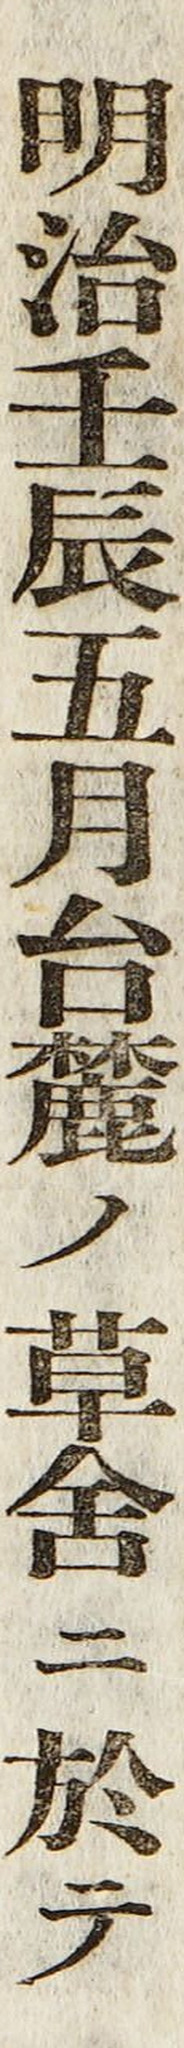明治壬辰五月台麓ノ草舎ニ於テ
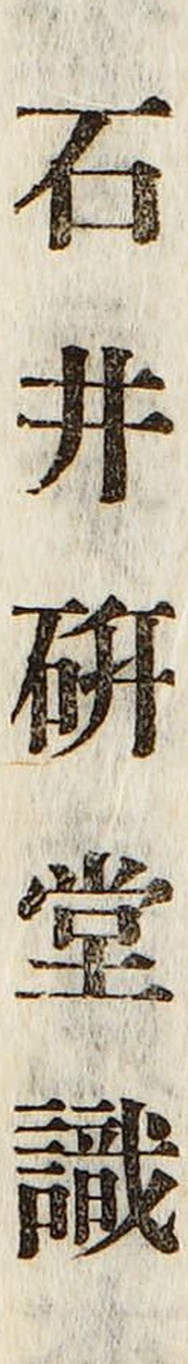石井研堂識
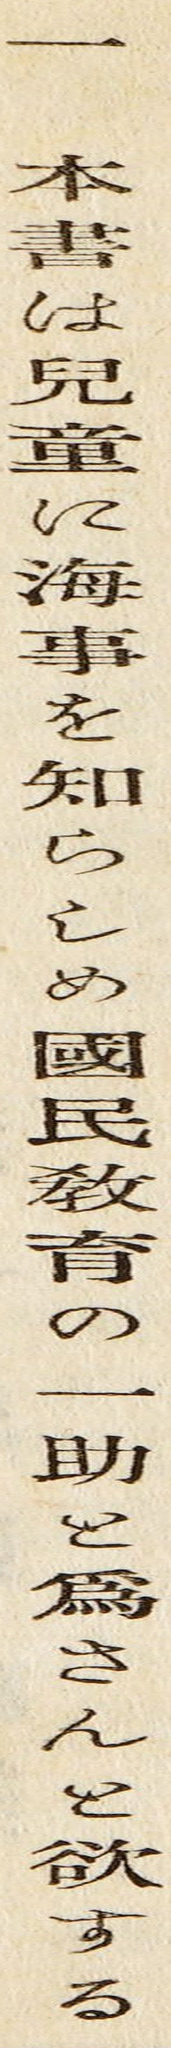一本書は児童に海事を知らしめ国民教育の一助と為さんと欲する
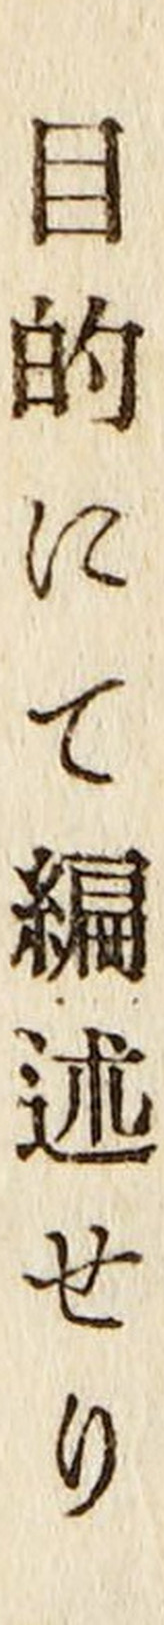目的にて編述せり
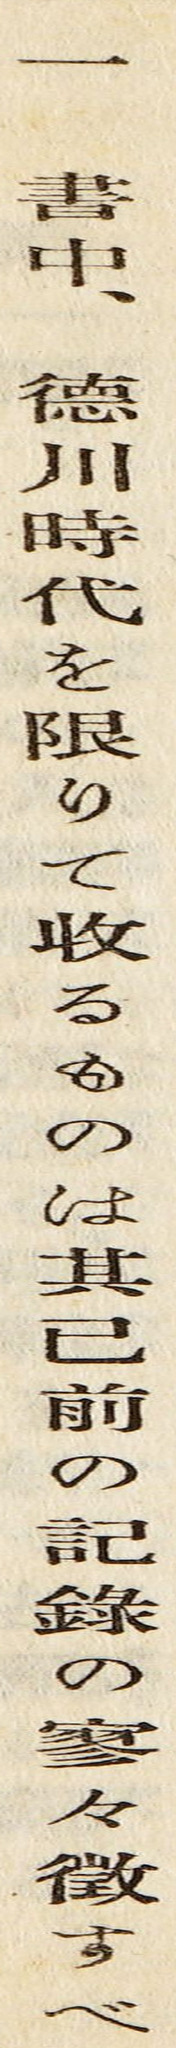一書中、徳川時代を限りて収るものは其已前の記録の寥々徴すべ
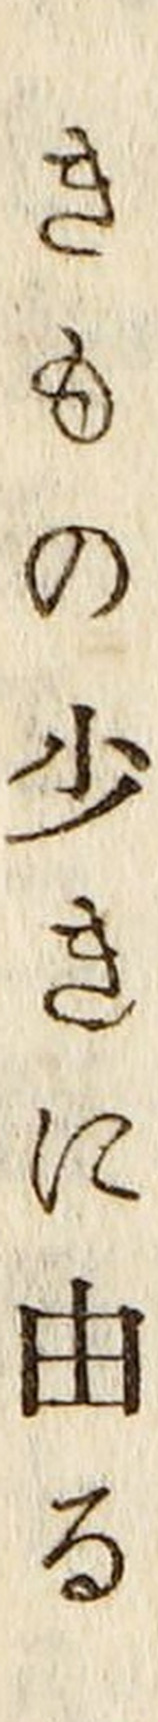きもの少きに由る
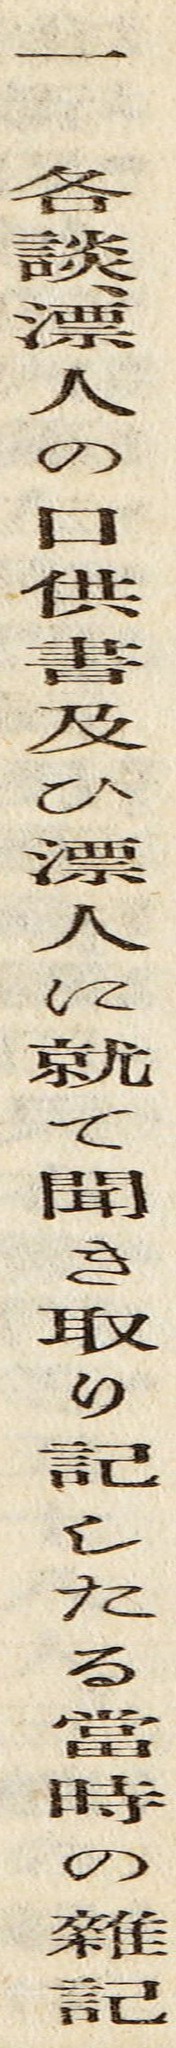一各談、漂人の口供書及ひ漂人に就て聞き取り記したる当時の雑記
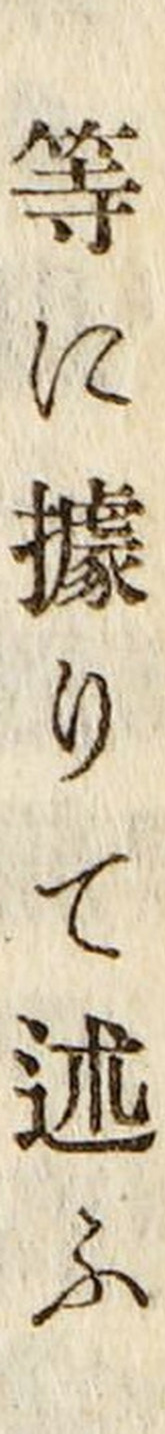等に拠りて述ふ
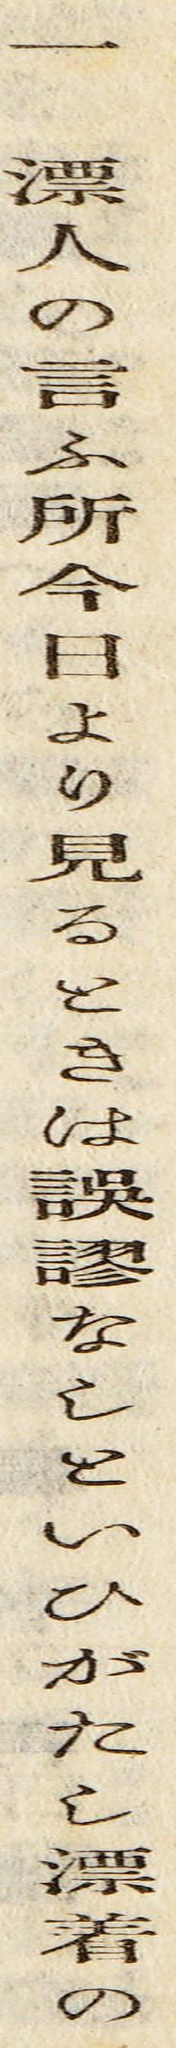一漂人の言ふ所今日より見るときは誤謬なしといひがたし漂着の
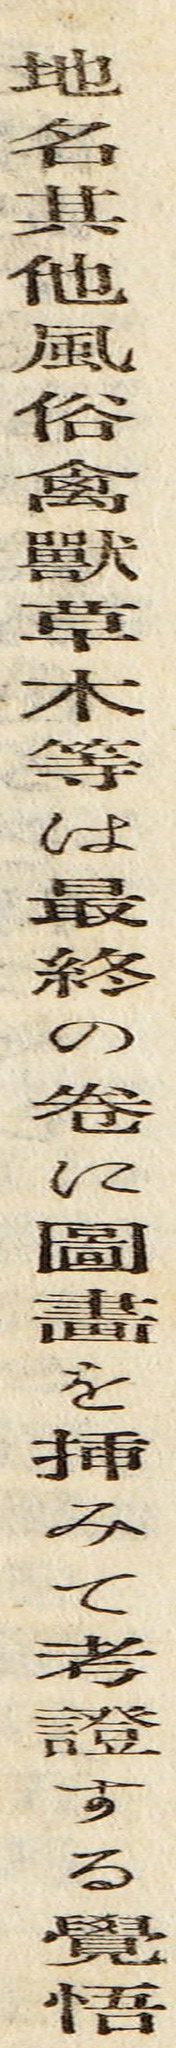地名其他風俗禽獣草木等は最終の巻に図画を挿みて考証する覚悟
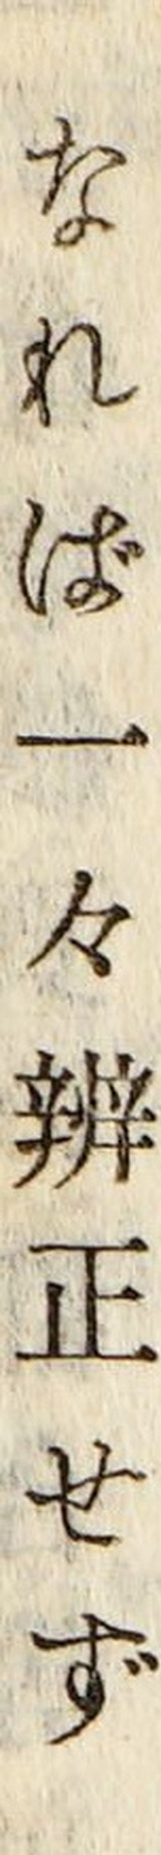なれば一々弁正せず
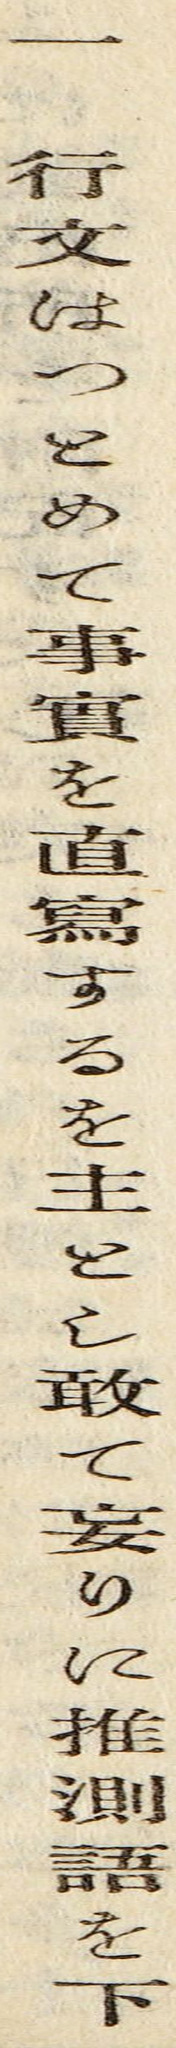一行文はつとめて事実を直写するを主とし敢て妄りに推測語を下

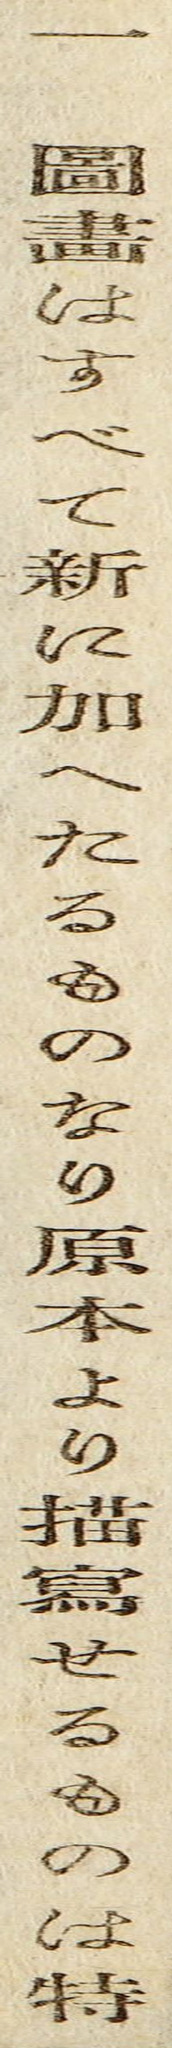一図画はすべて新に加へたるものなり原本より描写せるものは特
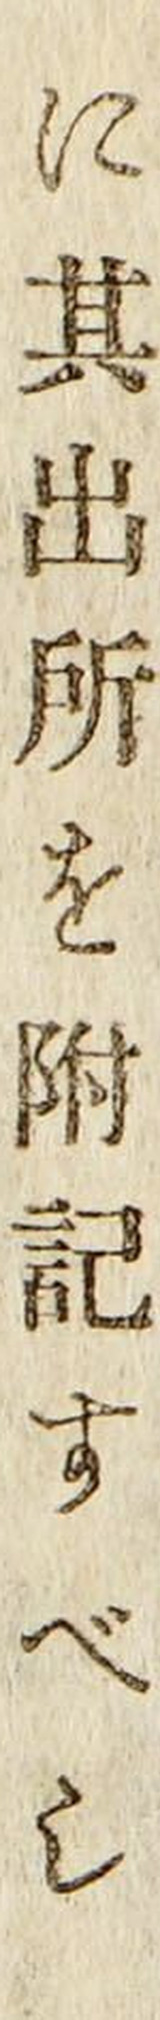に其出所を附記すべし
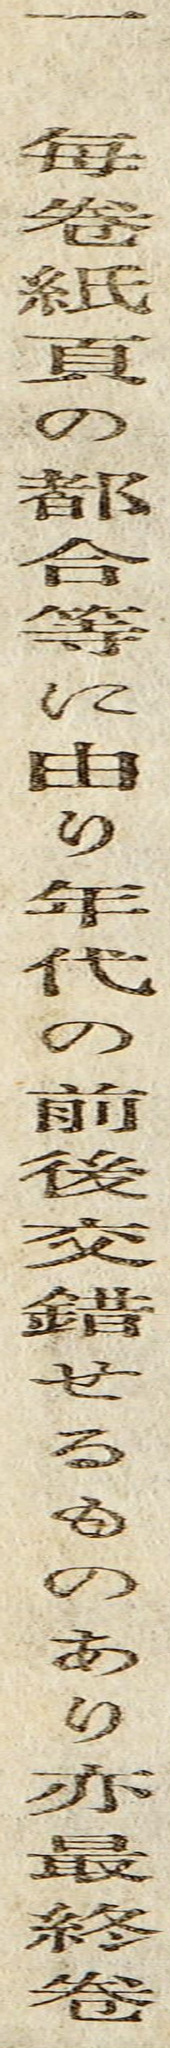一毎巻紙頁の都合等に由り年代の前後交錯せるものあり亦最終巻
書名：日本漂流譚
